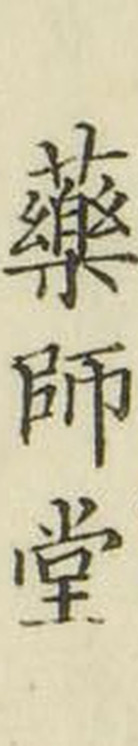薬師堂

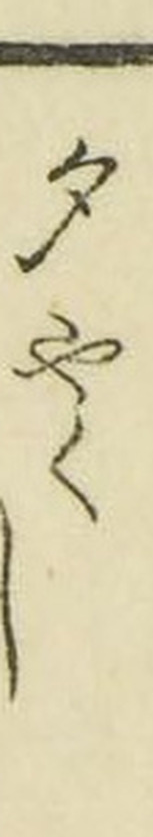夕やくし
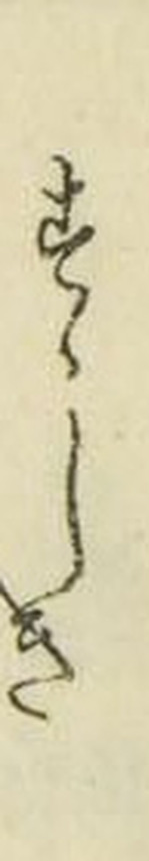すゝしき
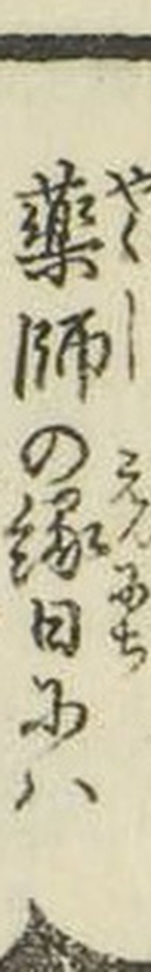薬師の縁日には
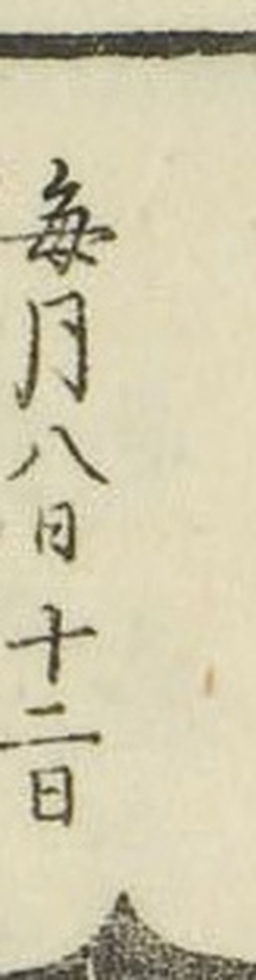毎月八月十二日
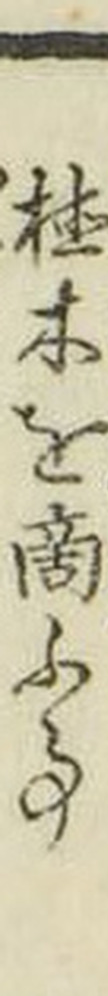植木を商ふ事
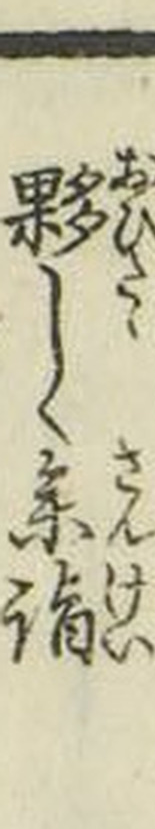夥しく参詣
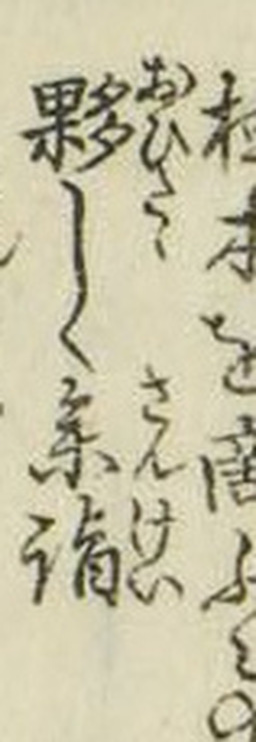夥しく参詣
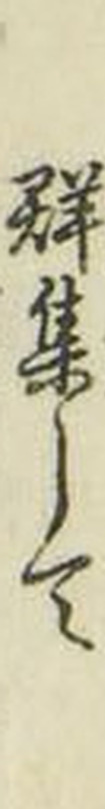群集して
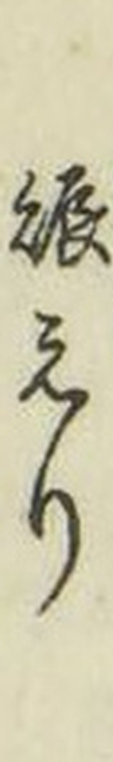賑えり

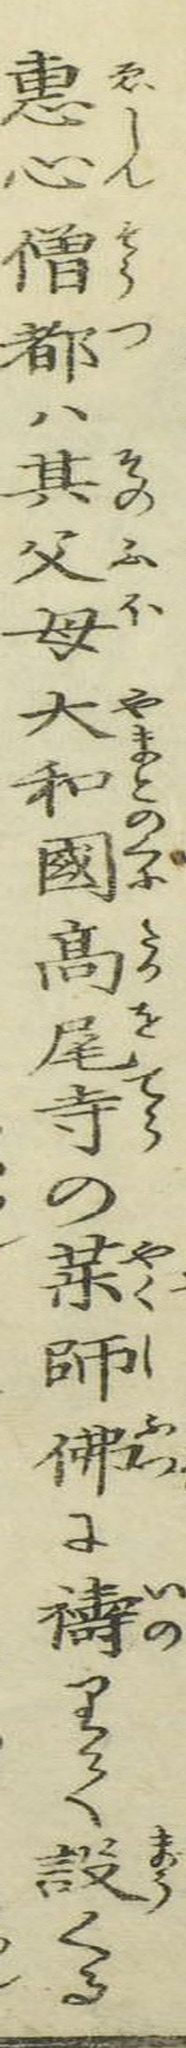恵心僧都は其父母大和國高尾寺の薬師佛に禱りて設くる
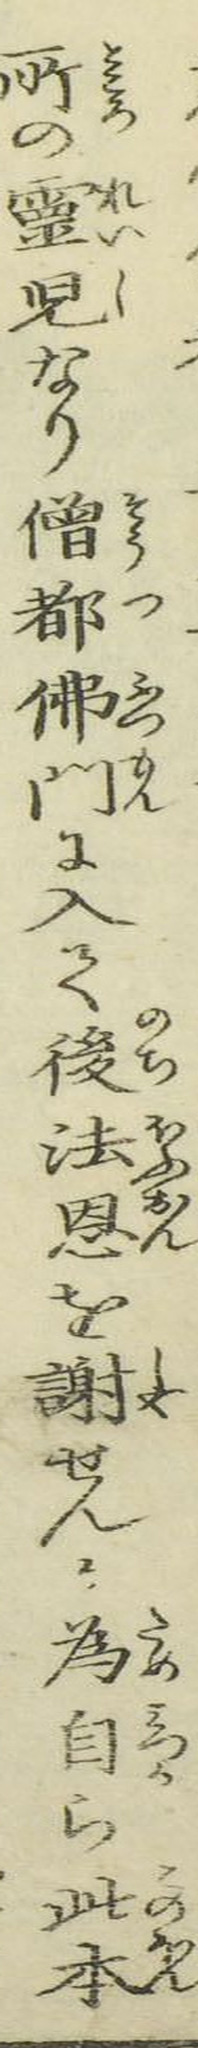所の霊児なり僧都佛門に入て後法恩を謝せんか為自ら此本
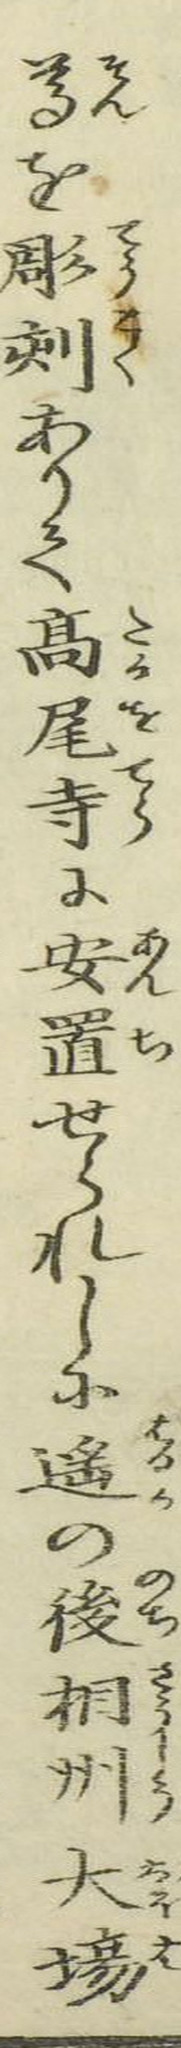尊を彫刻ありて高尾寺に安置せられしに遥の後相州大場
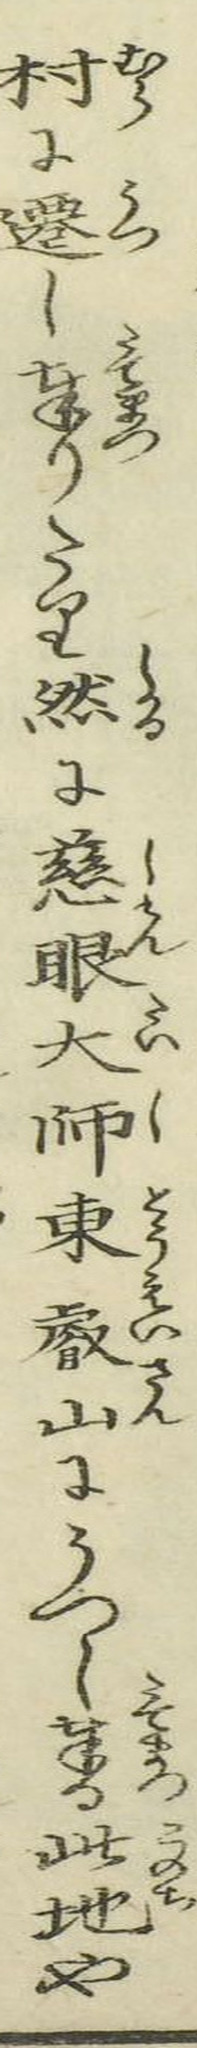村に遷し奉りたり然に慈眼大師東叡山にうつし奉る此地也
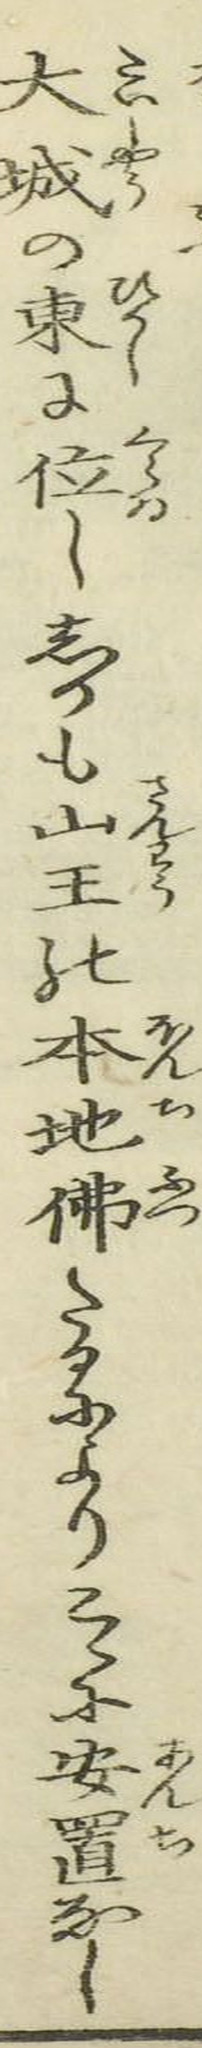大城の東に位ししかも山王の本地佛たるによりこゝに安置なし
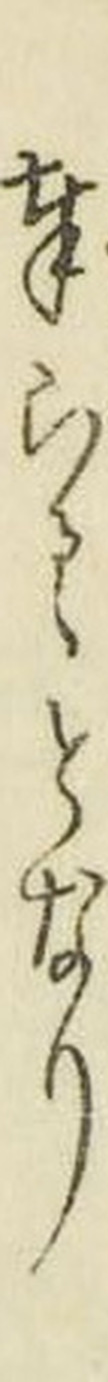奉らるゝとなり
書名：江戸名所図会 20巻 巻之2
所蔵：東京学芸大学教育コンテンツアーカイブ
